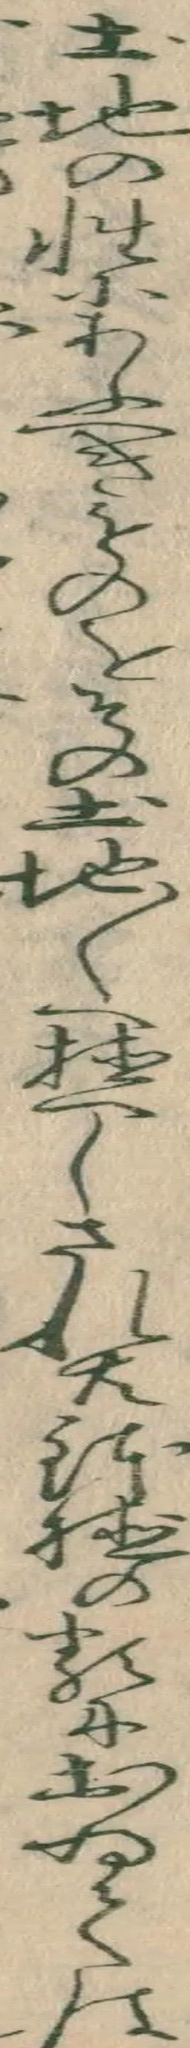○土地の性にあふへきものをその土地〳〵へ植へしされ共鉢植の類におゐては
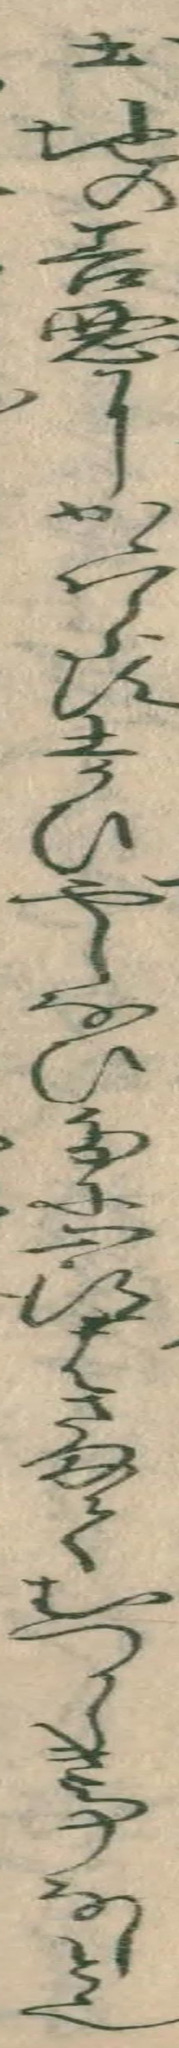土地の吉悪にかゝはらす土かひやしなひたに心得はさまてむつかしき事なしと也
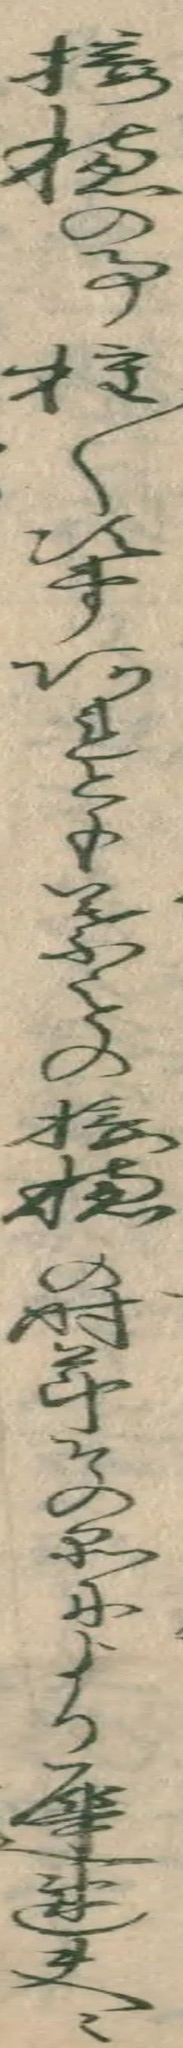○接穂の事種〳〵次第あれとも葉もの接穂の時節その品により遅速夫々
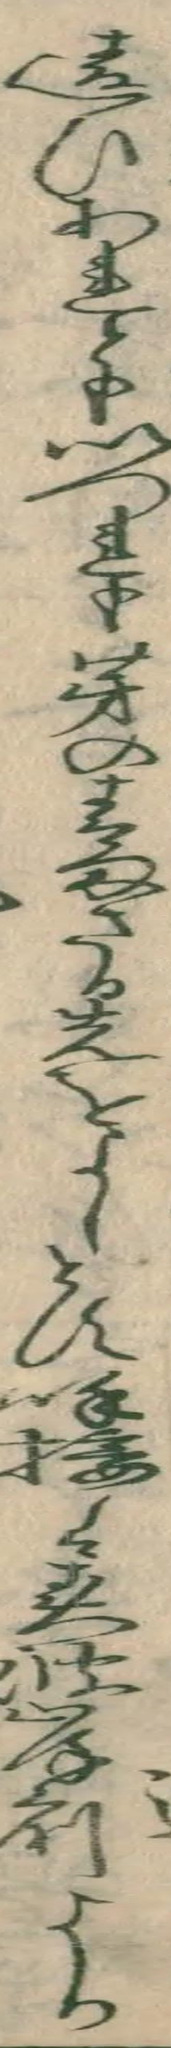違ひあれともいつれも芽の青まさる先をよしとす呼接は春彼岸前より
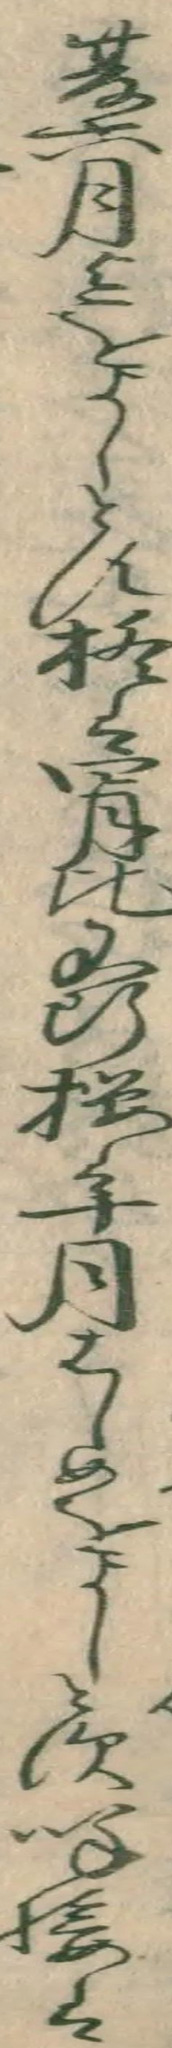夏六月迄をよしとす柊は四月比不断桜は十月はしめをよしとす呼接は
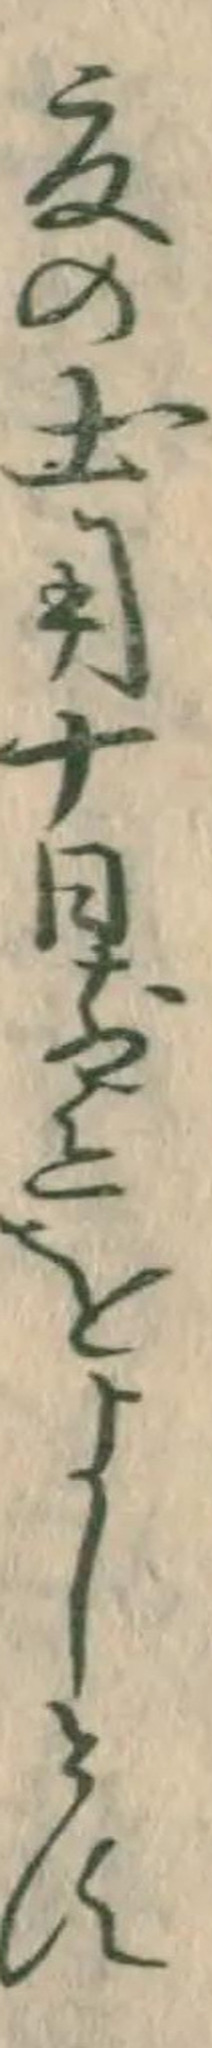夏の土用十日前迄をよしとす
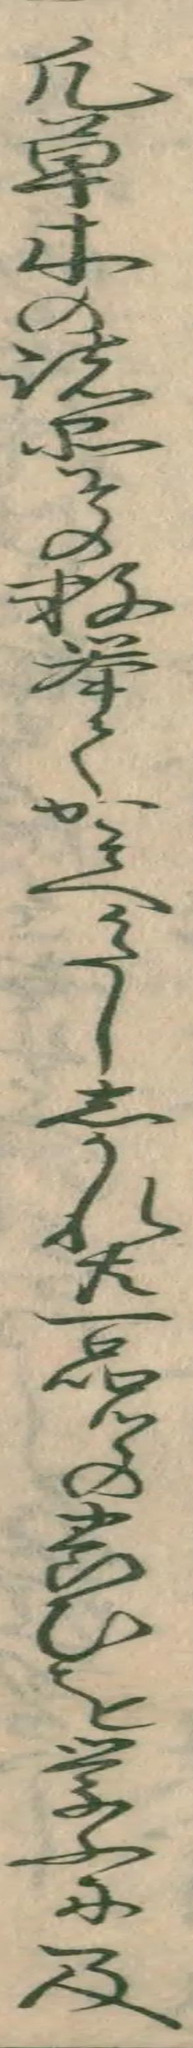○凡草木の諸品その数挙てかそへかたししかれ共一品つゝの養ひを学ふに及

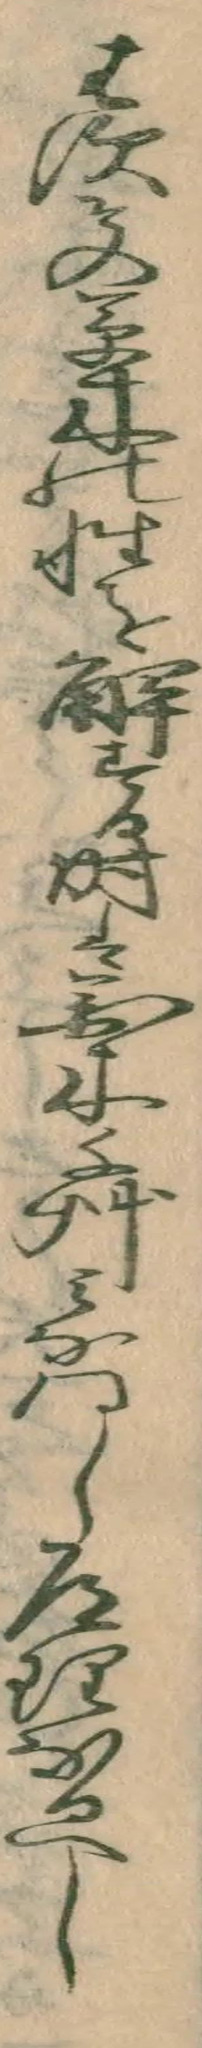はすその草木の性を解する時は万木千草みな同し道理なるへし
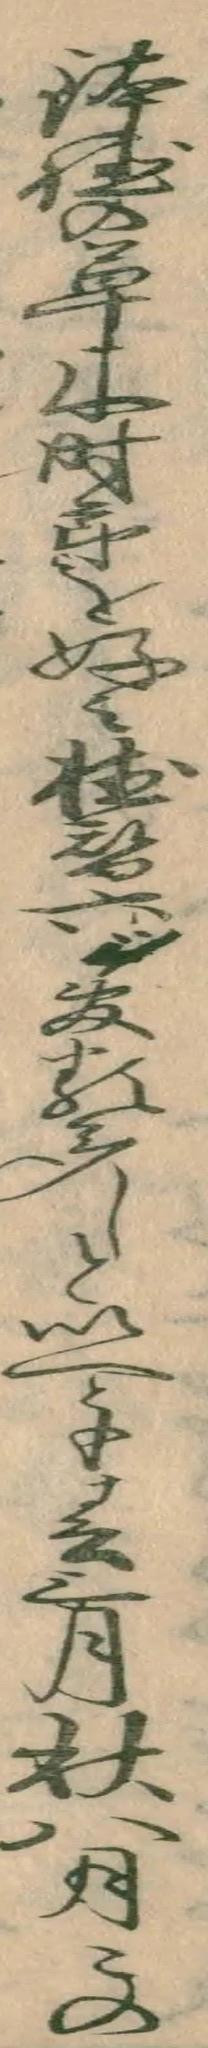○鉢植の草木時節を好み植替六ッヶ敷類多しといへとも春三月秋八月この
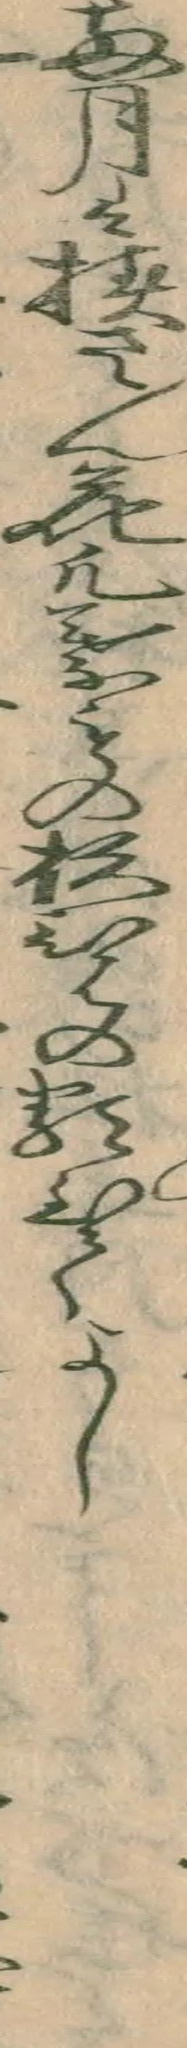両月は椿さゝん花凡葉もの杉ひはの類至てよし
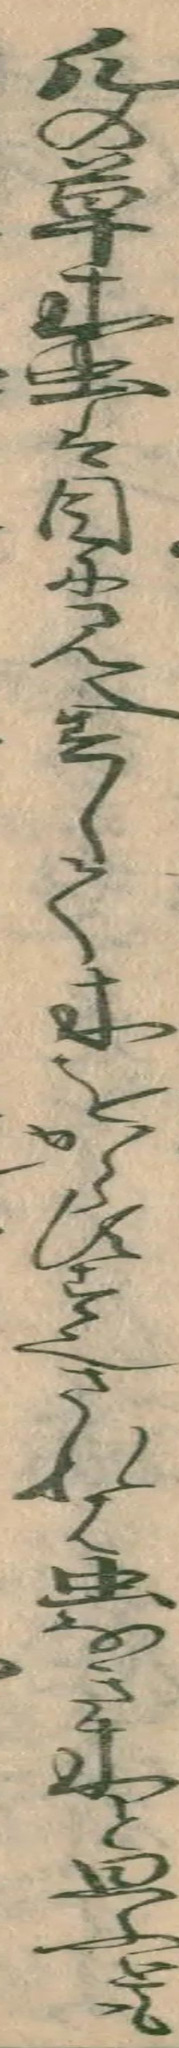○凡の草木虫は目に見へすして木をからすす也されは虫なき木と思ふとも
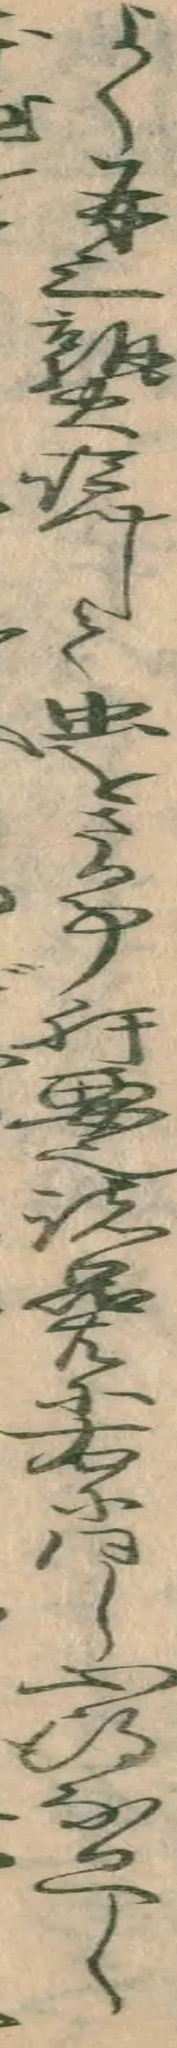よく再三熟覧して虫をさる事肝要也諸品共に右に同し心得なるへし
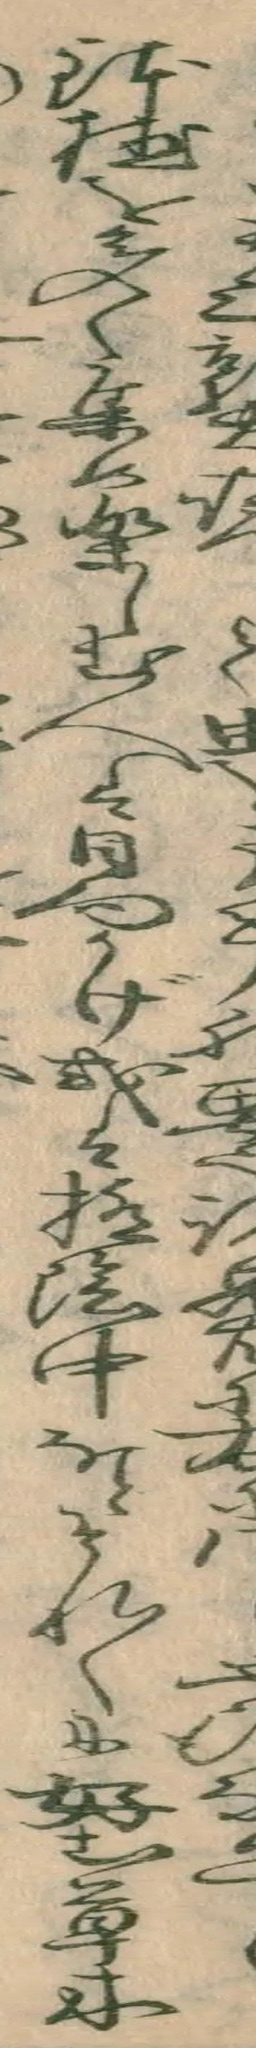○鉢植を多く集め楽しむ人は日向かげ或は極陰中なとそれ〳〵に好む草木
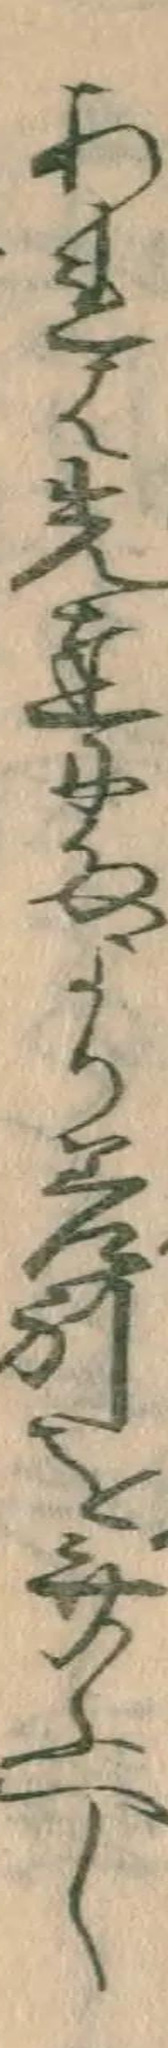あれは先達にたより差別を弄弁ふへし
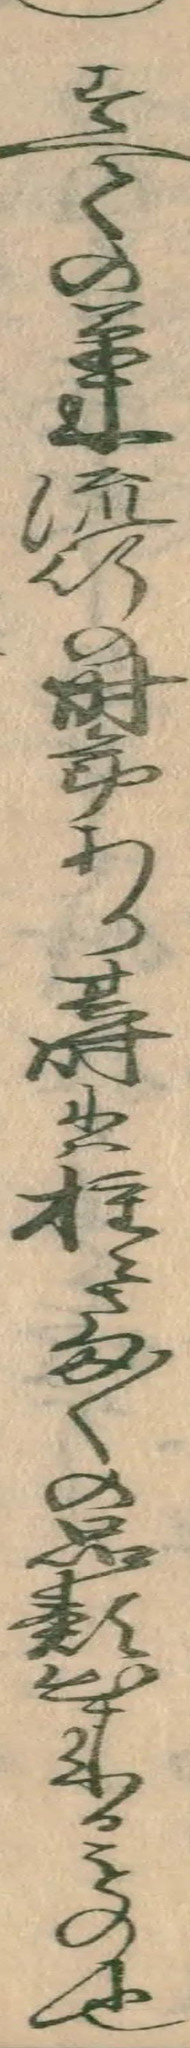○すへての草木流行の時節あり其時には種々さま〳〵の品数出来るもの也
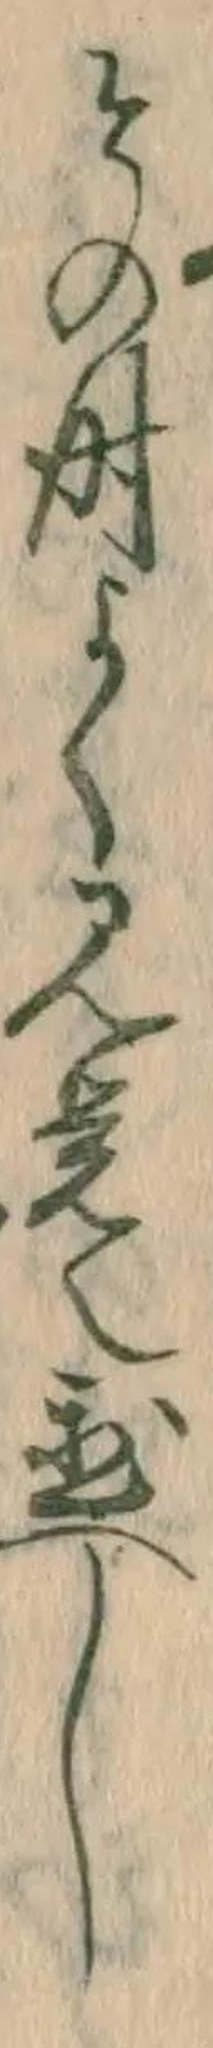その時よく見覚之え置へし
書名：草木奇品家雅見 3巻. [3]
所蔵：国立国会図書館 National Diet Library, JAPAN
